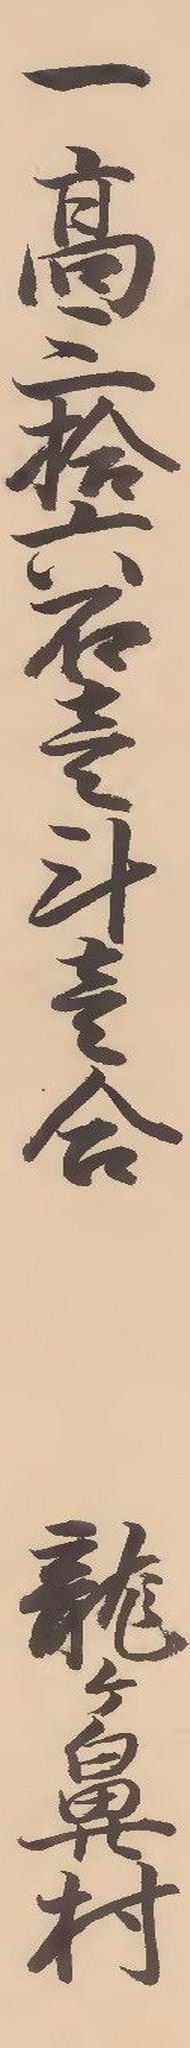一髙三拾六石壱斗壱合龍ケ鼻村
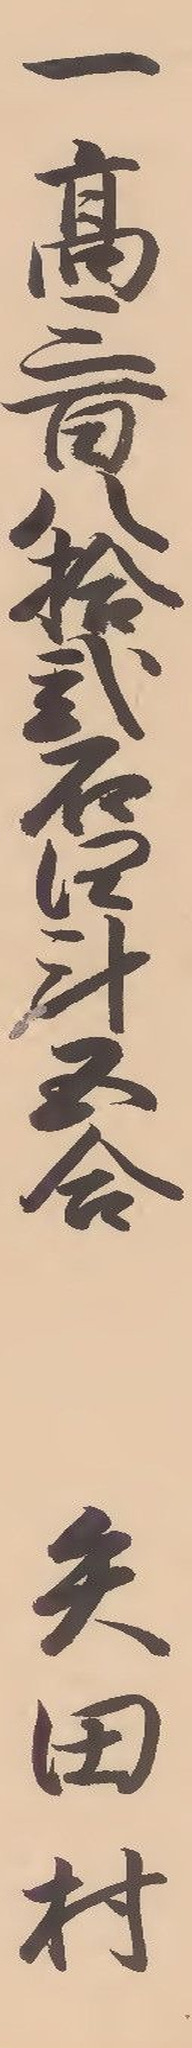一髙三百八拾弐石四斗五合矢田村

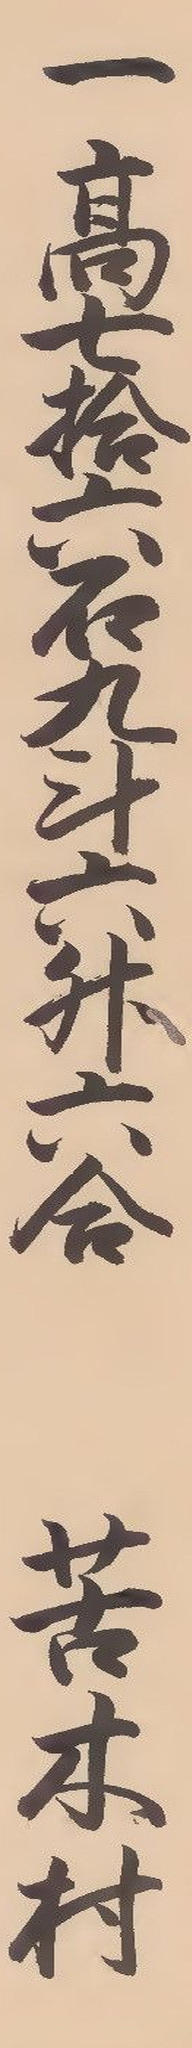一髙七拾六石九斗六升六合苦木村
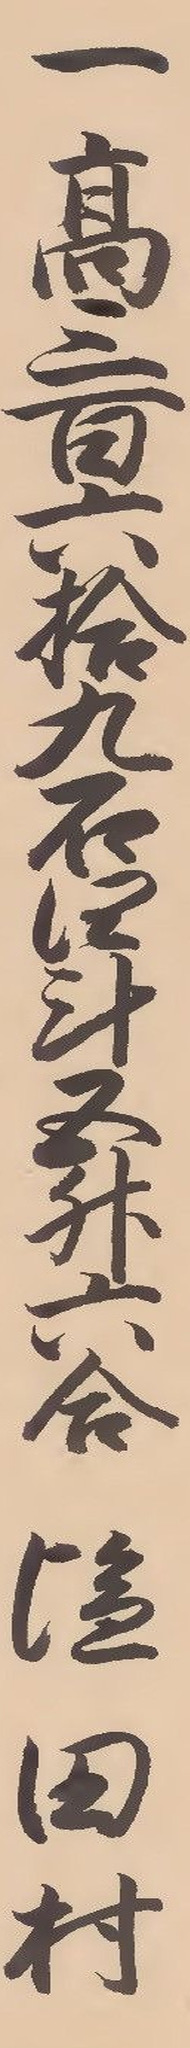一髙三百六拾九石四斗五升六合塩田村
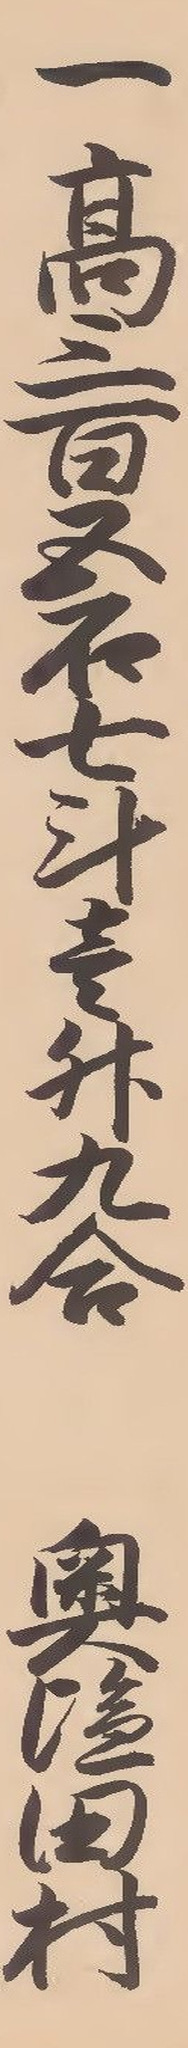一髙三百五石七斗壱升九合奥塩田村
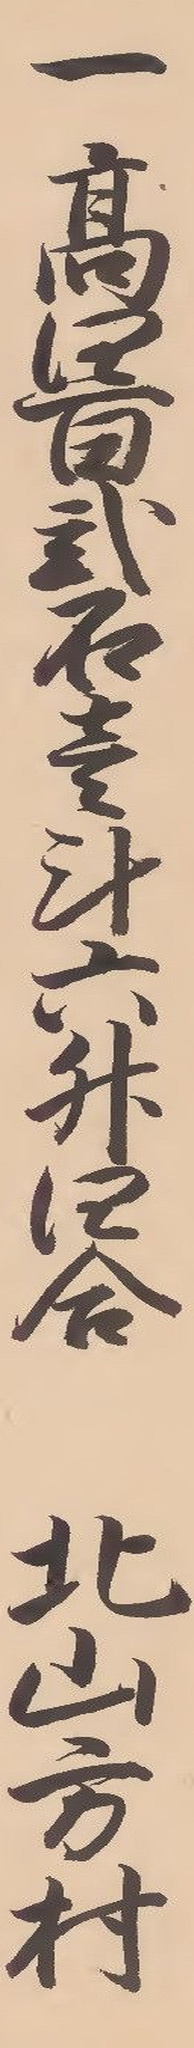一髙四百弐石壱斗六升四合北山方村
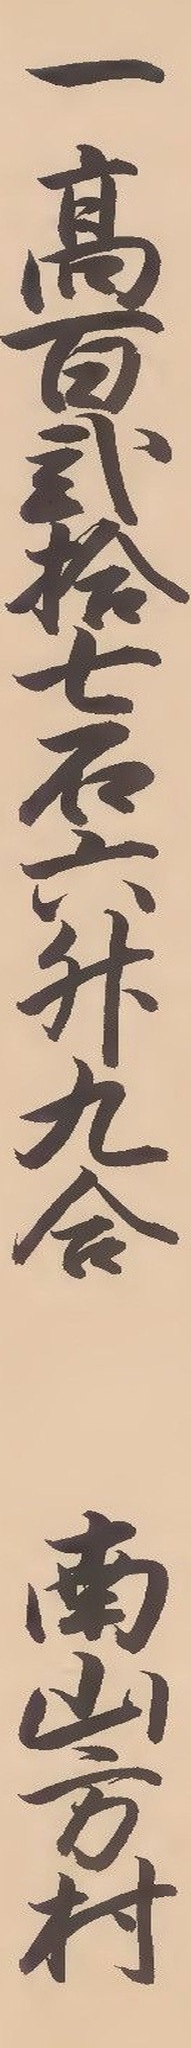一髙百弐拾七石六升九合南山方村
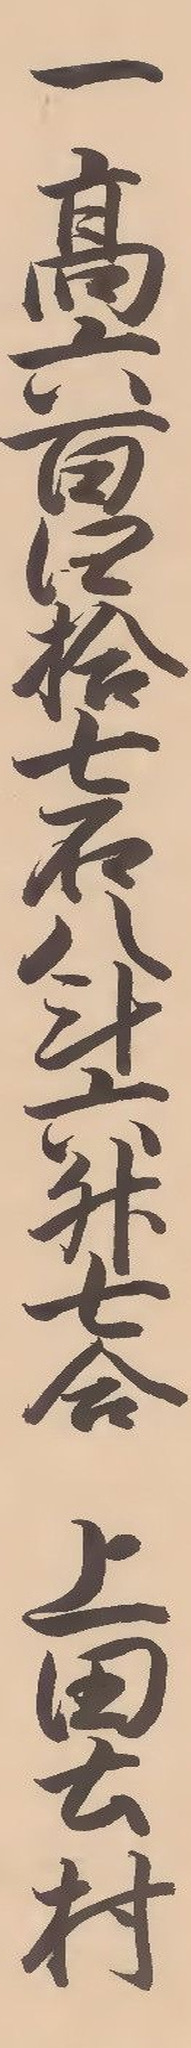一髙六百四拾七石八斗六升七合上田土村
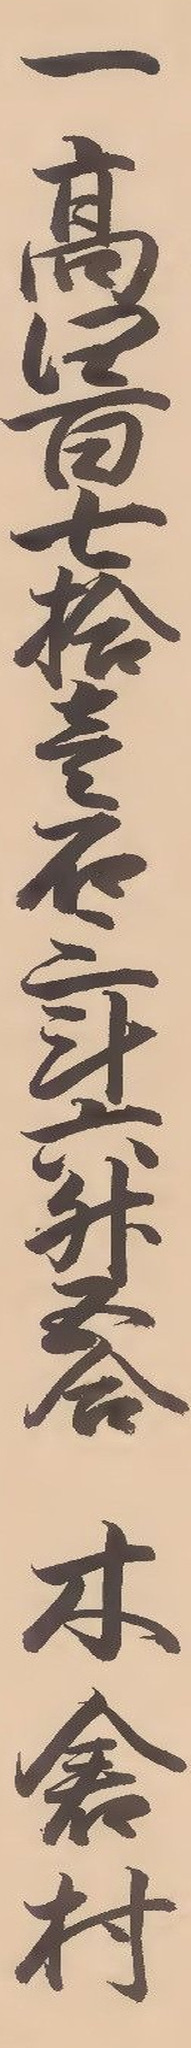一髙四百七拾壱石三斗六升五合木倉村
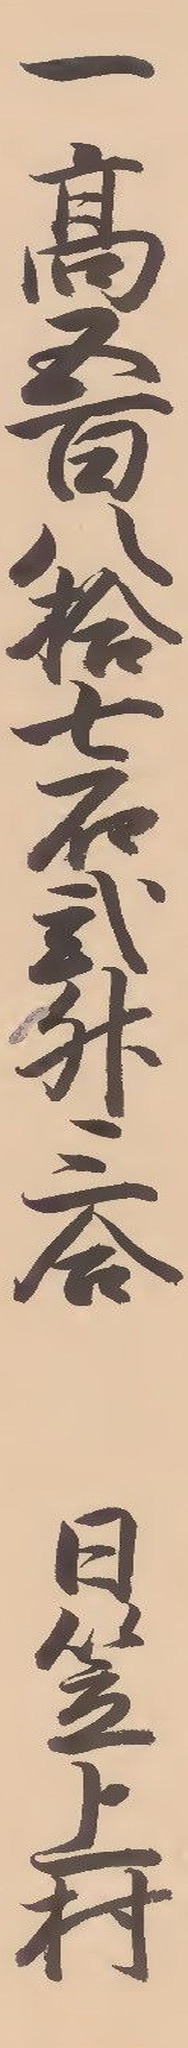一髙五百八拾七石弐升三合日笠上村

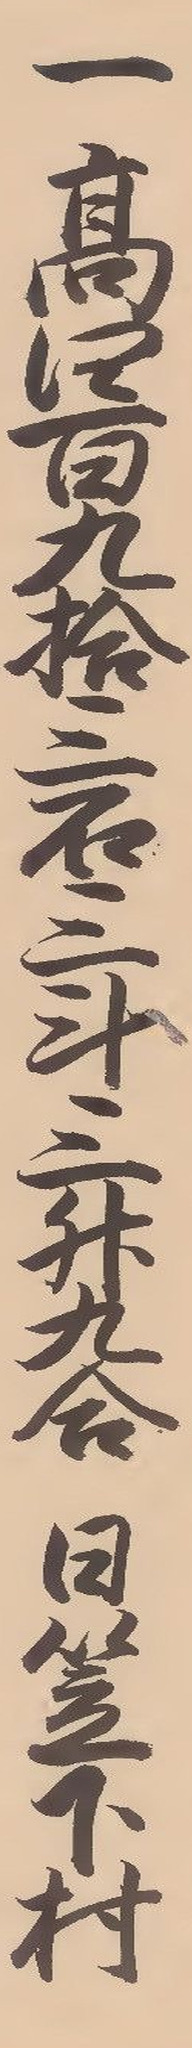一髙四百九拾三石三斗三升九合日笠下村
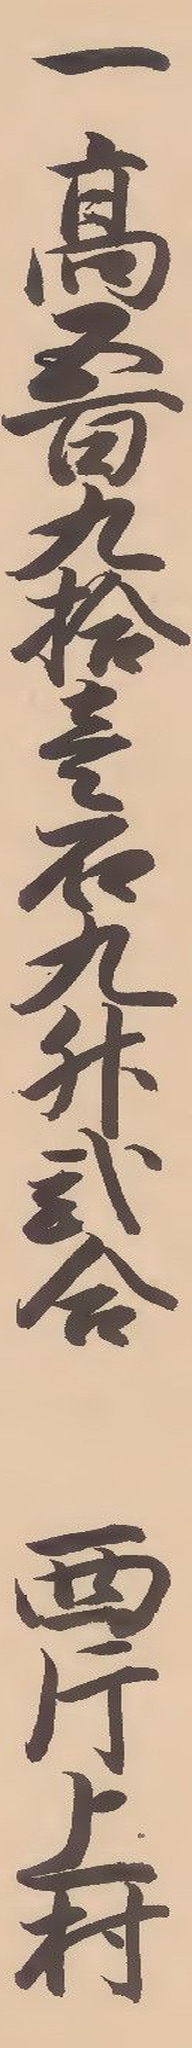一髙五百九拾壱石九升弐合西片上村
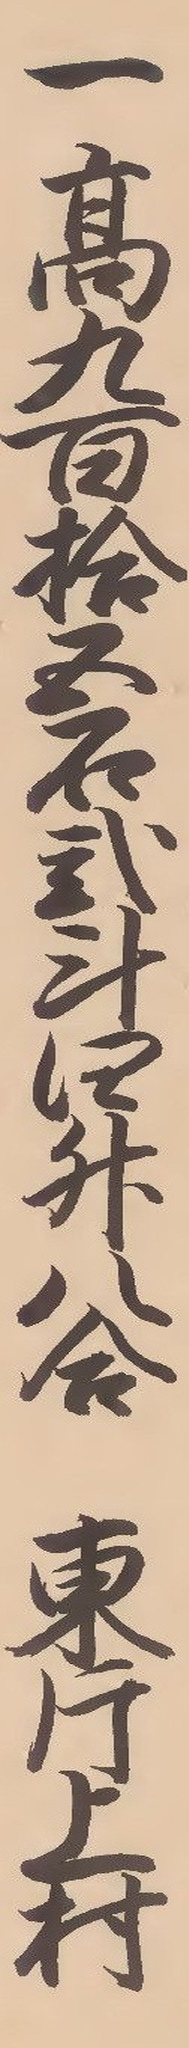一髙九百拾五石弐斗四升八合東片上村
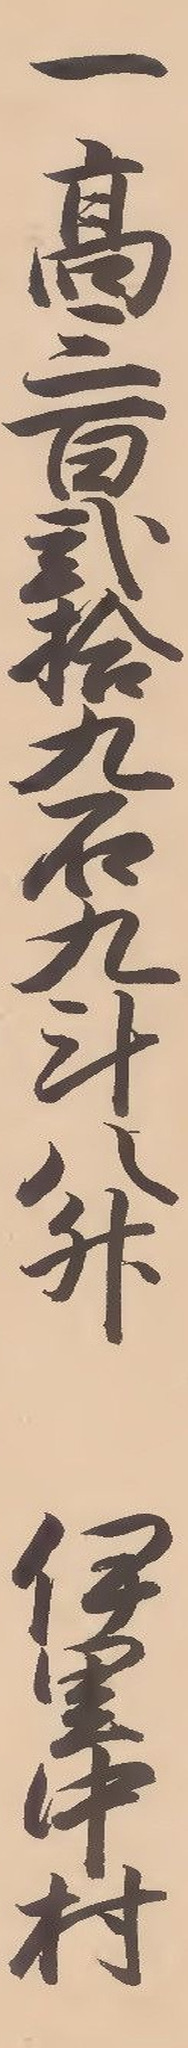一髙三百弐拾九石九斗八升伊里中村
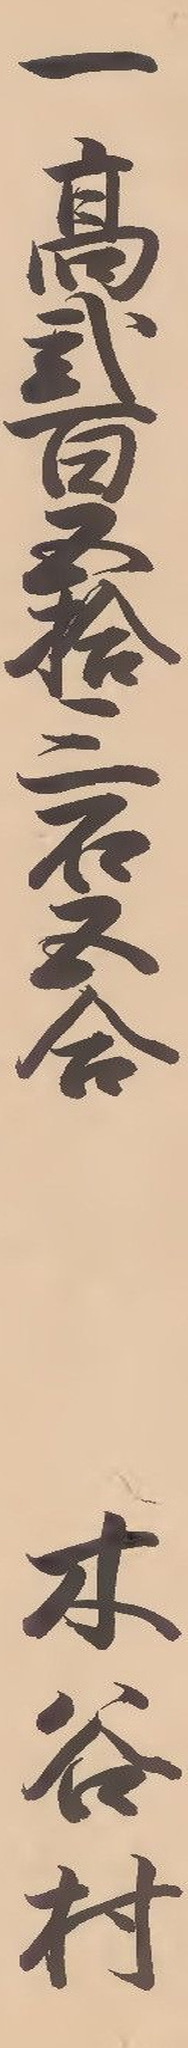一髙弐百五拾三石五合木谷村
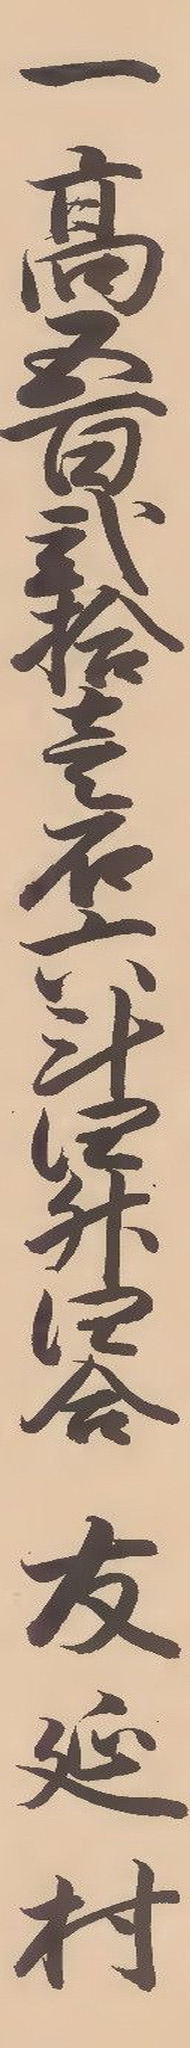一髙五百弐拾壱石六斗四升四合友延村
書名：備前国郷帳
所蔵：国立公文書館 National Archives of Japan
